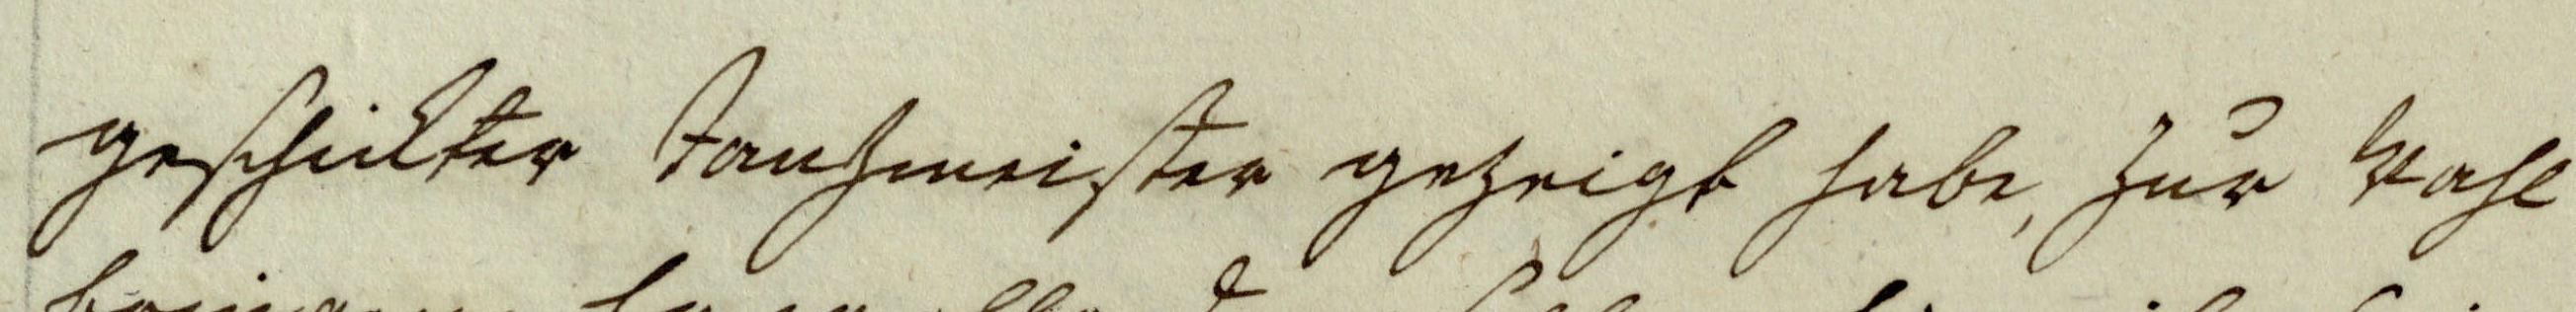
geschickter Tanzmeister gezeigt habe, zur Wahl
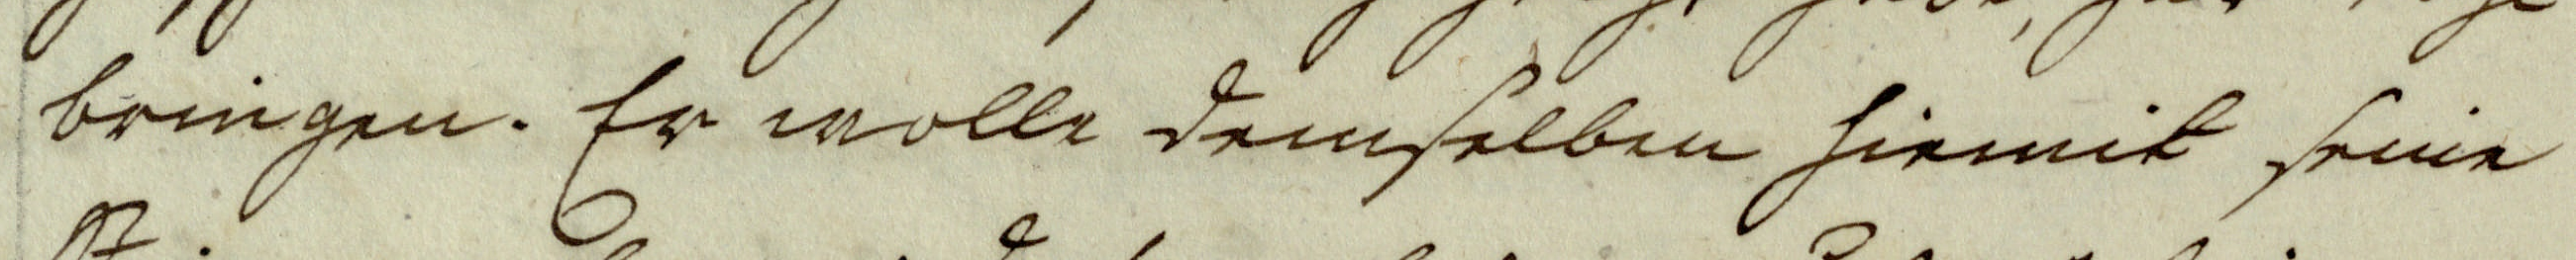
bringen. Er wolle demselben hiemit seine
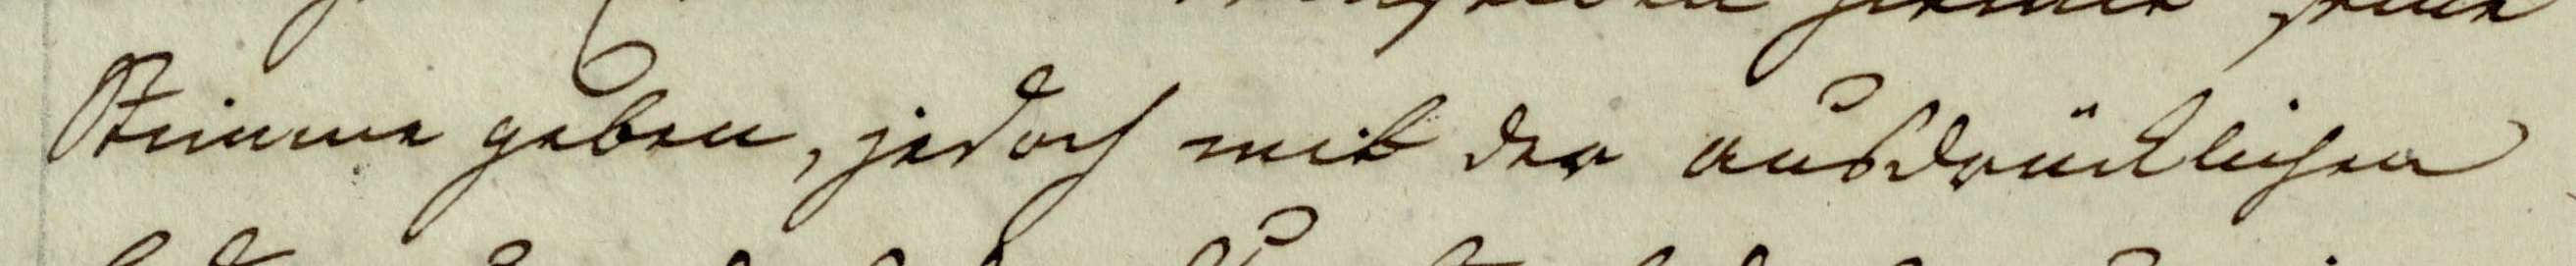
Stimme geben, jedoch mit der ausdrücklichen
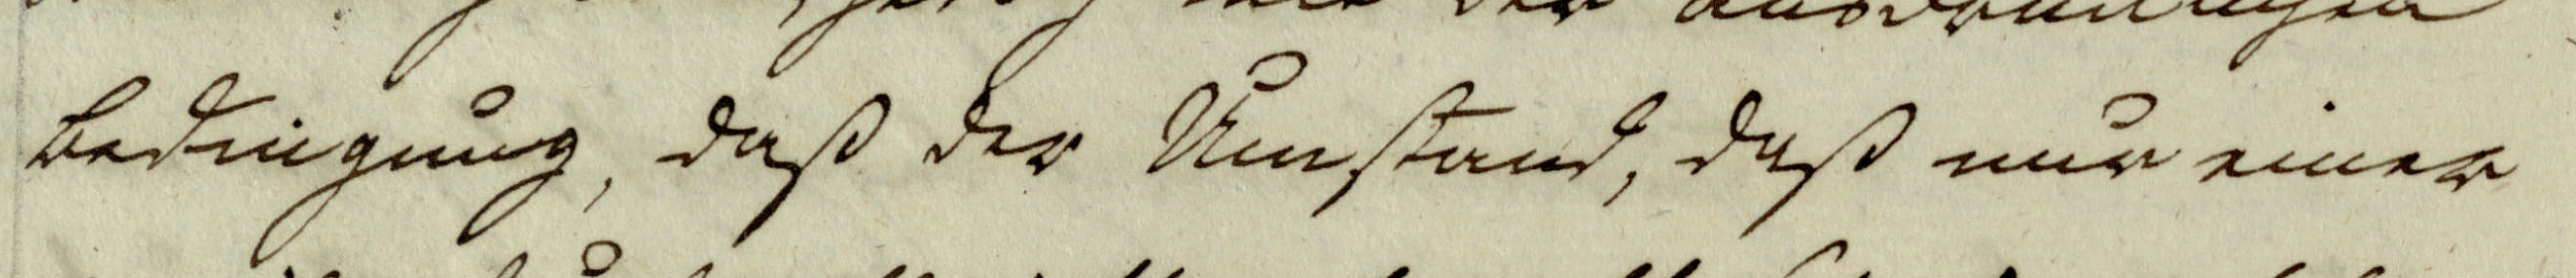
Bedingung, daß der Umstand, daß nur einer
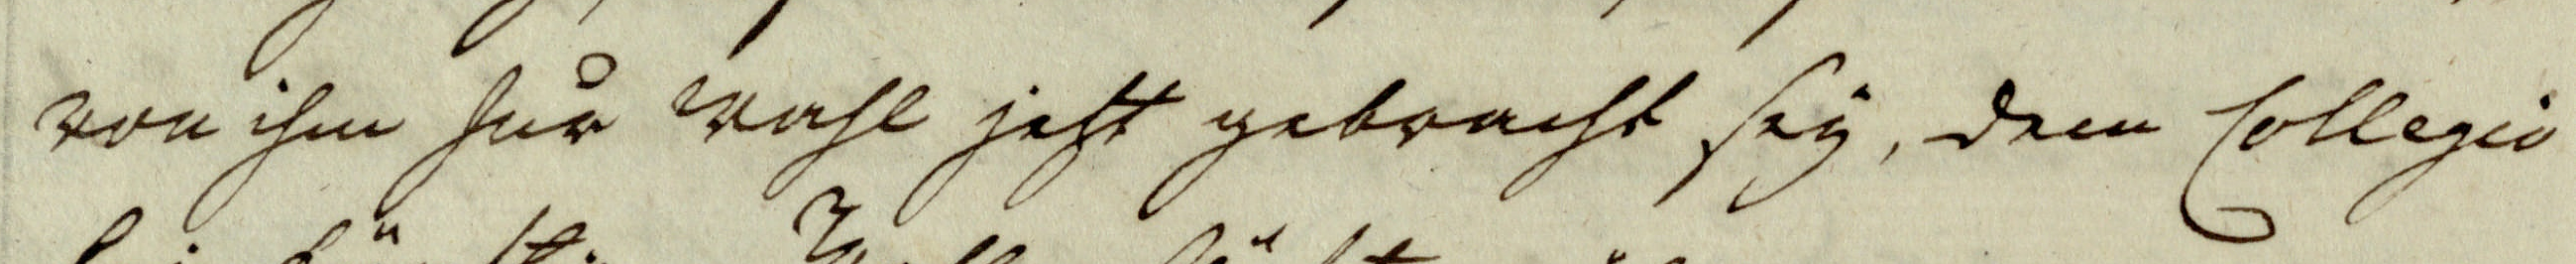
von ihm zur Wahl jetzt gebracht seÿ, dem Collegio
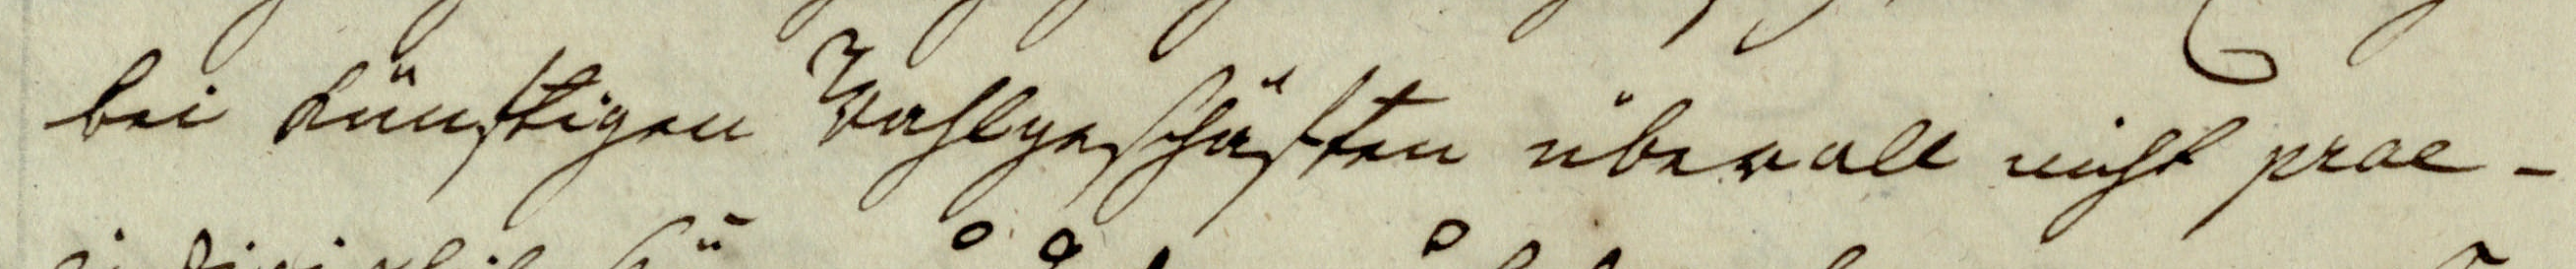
bei künftigen Wahlgeschäften überall nicht prae¬
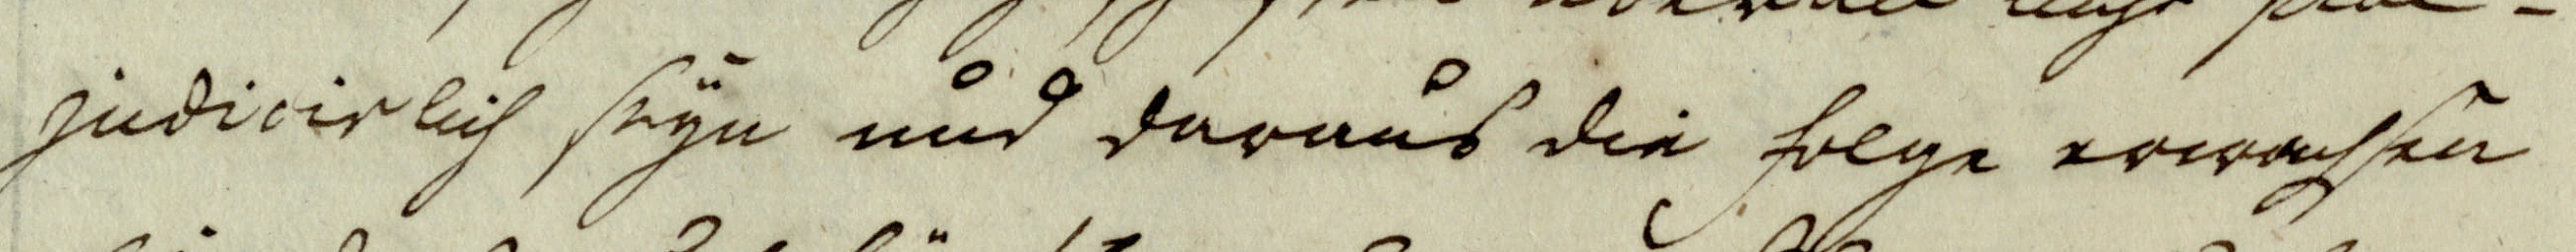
judicirlich seÿn und daraus die Folge erwachsen
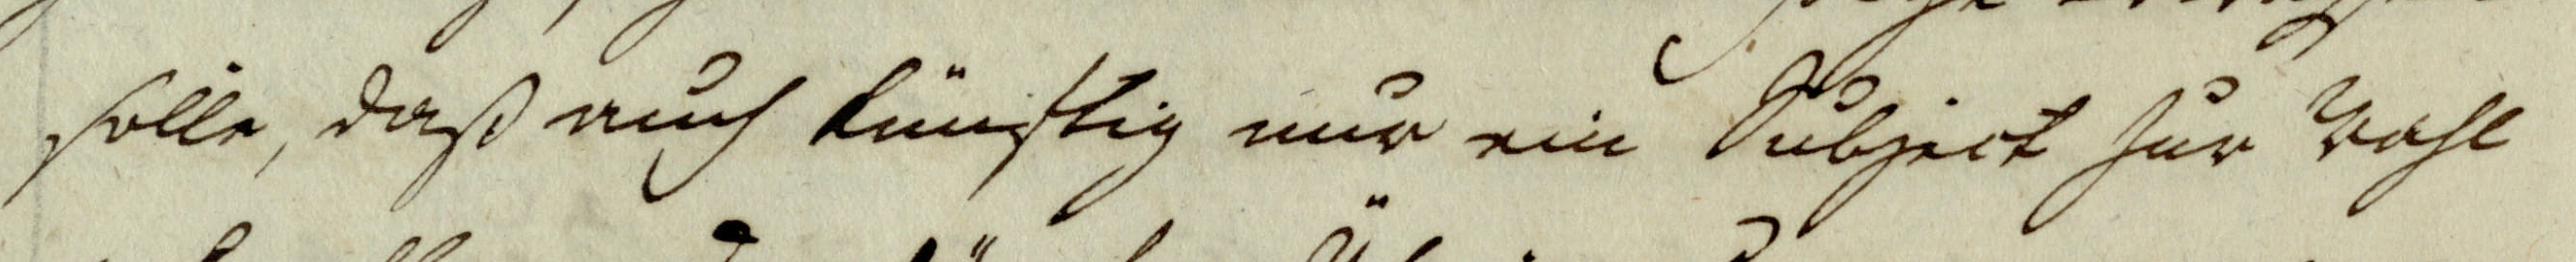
solle, daß auch künftig nur ein Subject zur Wahl
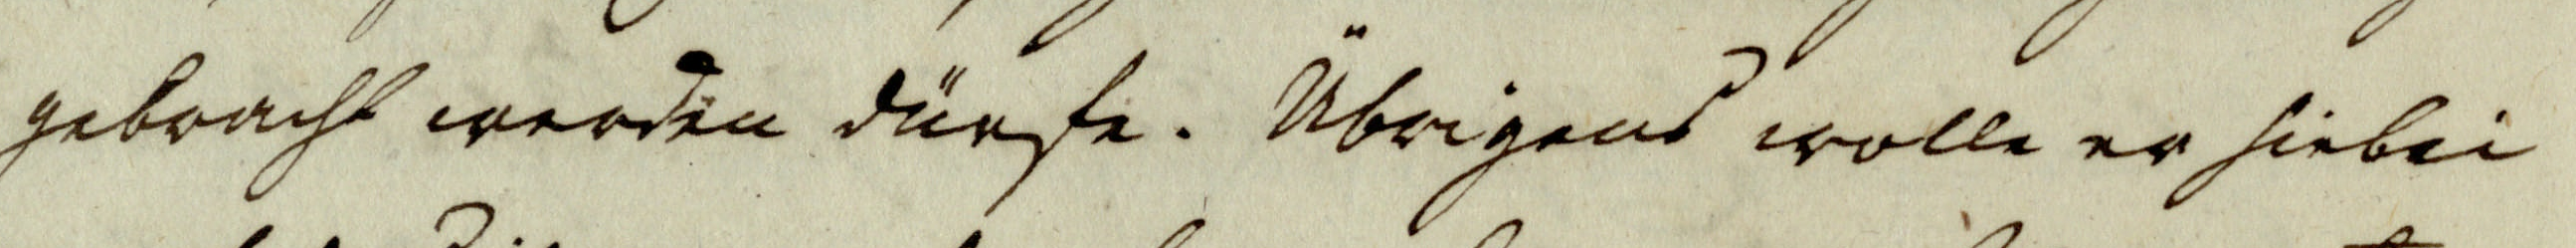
gebracht werden dürfe. Übrigens wolle er hiebei
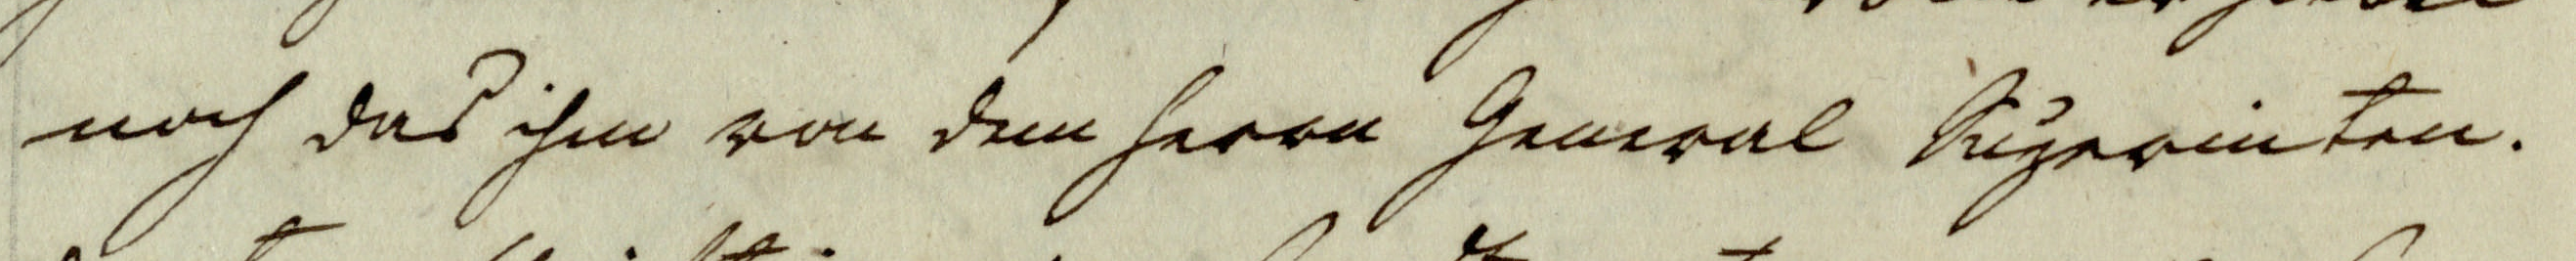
noch das ihm von dem Herrn General Superinten¬
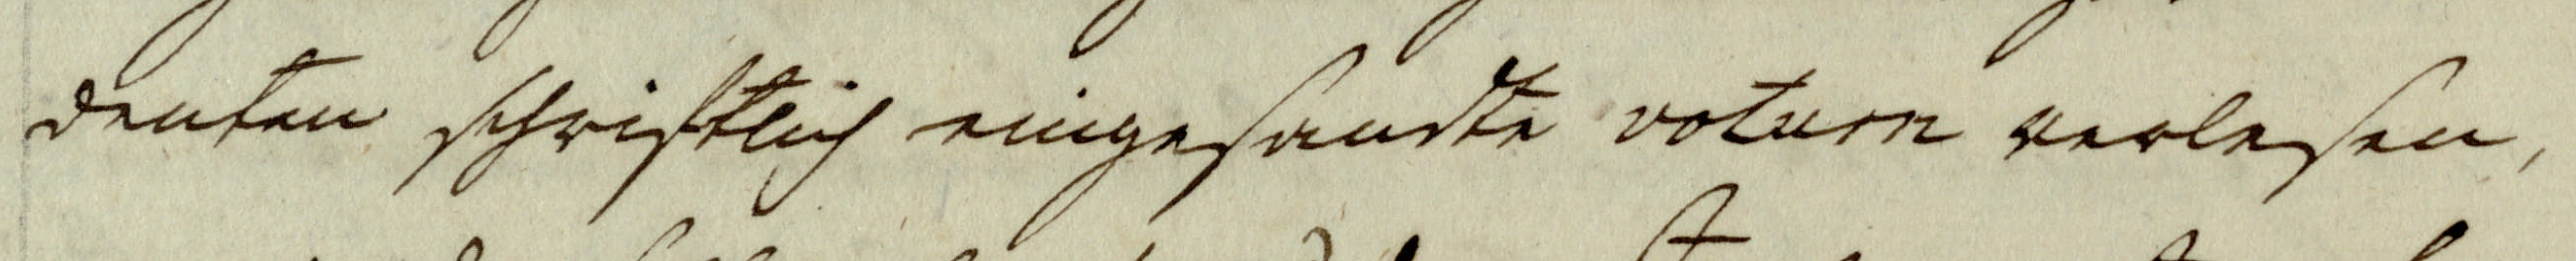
denten schriftlich eingesandte votum verlesen,
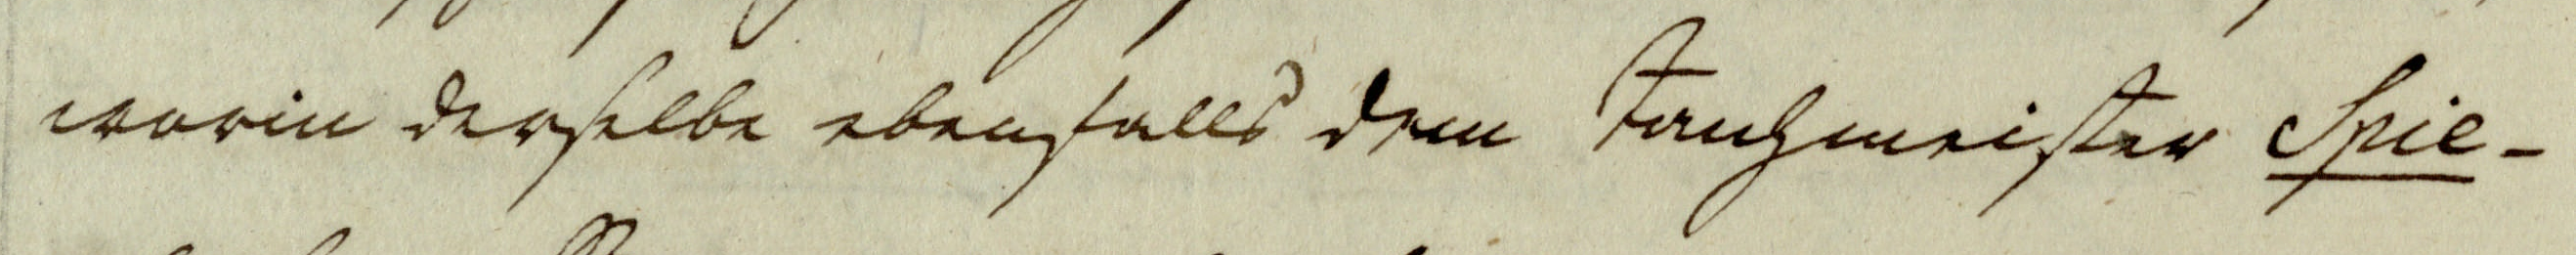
worin derselbe ebenfalls dem Tanzmeister Spie¬
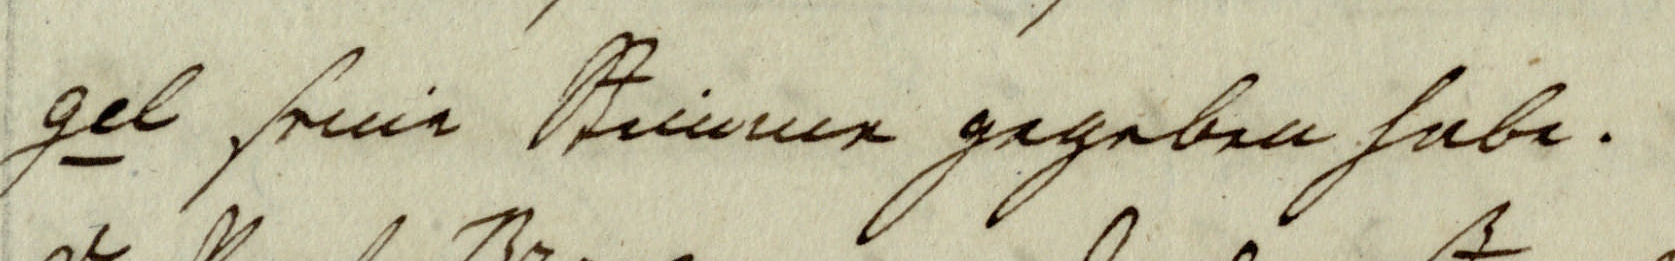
gel seine Stimme gegeben habe.
